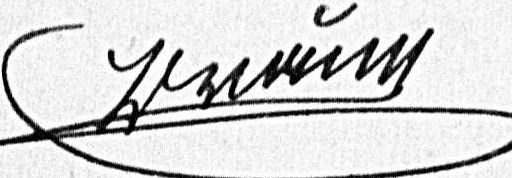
Braun
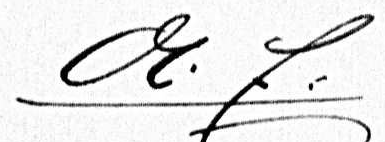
A. E.
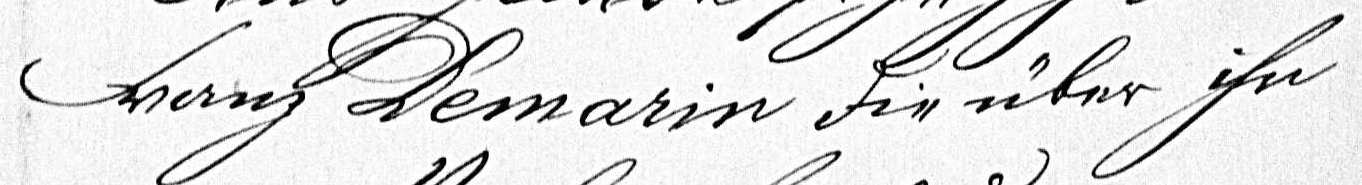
Franz Demarin die über ihn
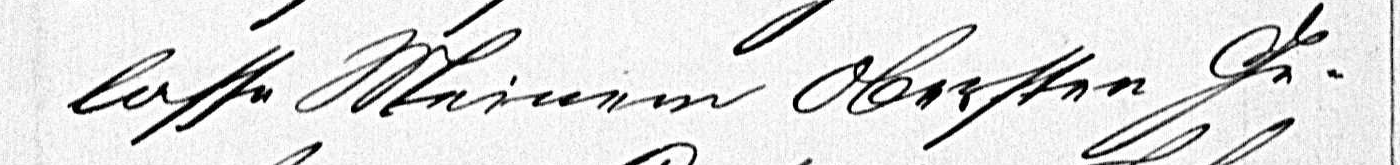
lasse Meinem Obersten Ge¬
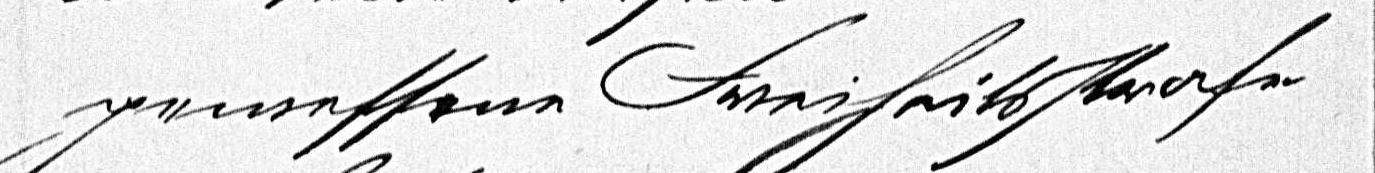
gemessene Freiheitsstrafe
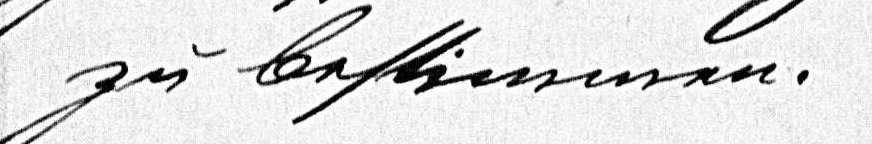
zu bestimmen.
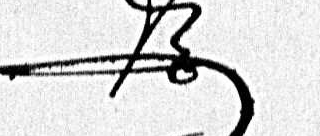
FJ
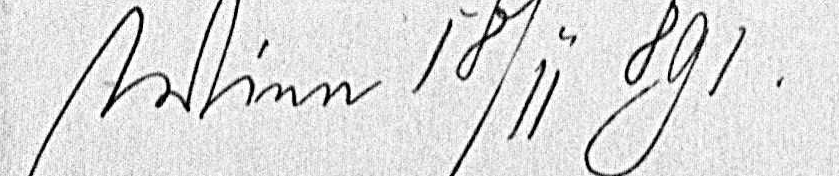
Wien, 18/11/1891
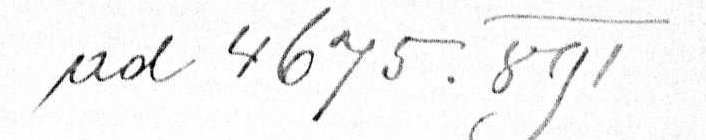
ad 4675 1891
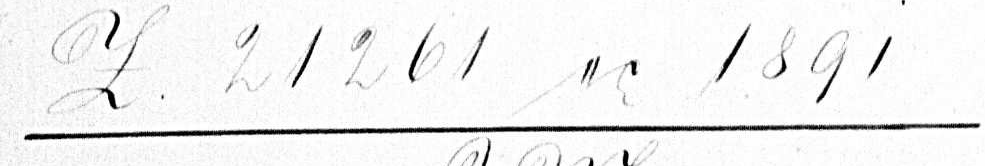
Z. 21261 1891/
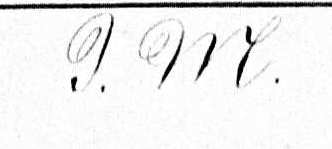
J.M.
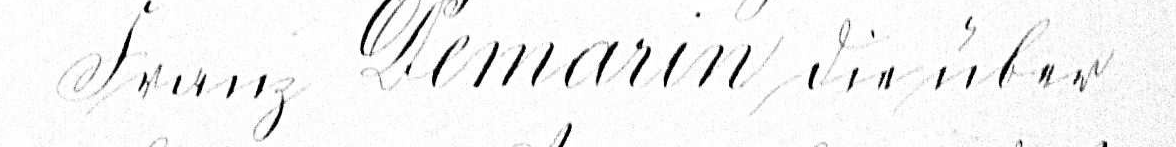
Franz Demarin die über
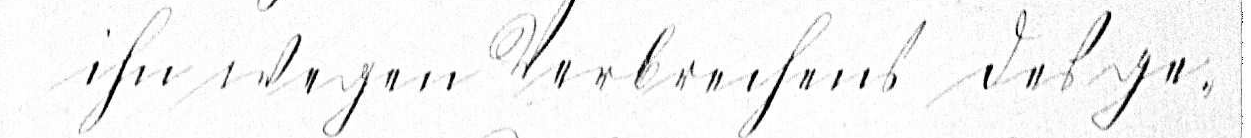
ihn wegen Verbrechens des ge¬
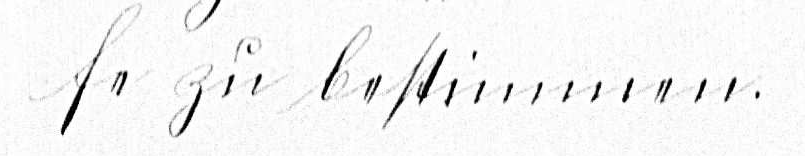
fe zu bestimmen.
